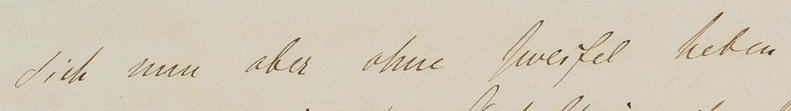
sich nun aber ohne Zweifel heben
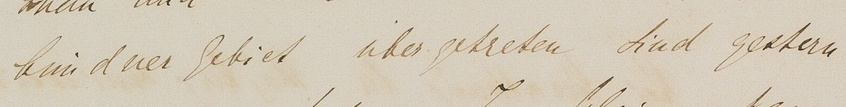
bündner Gebiet übergetreten sind gestern
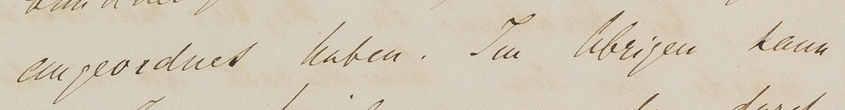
angeordnet haben. Im Übrigen kann
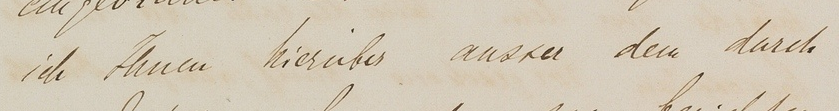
ich Ihnen hierüber ausser dem durch
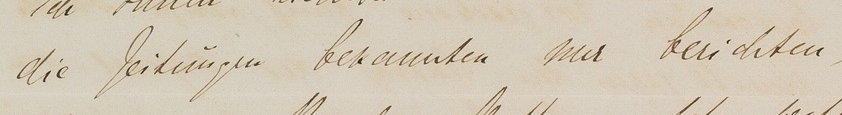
die Zeitungen bekannten nur berichten,
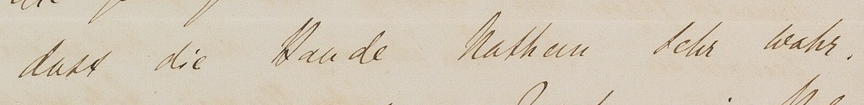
dass die Bande Nathan sehr wahr-
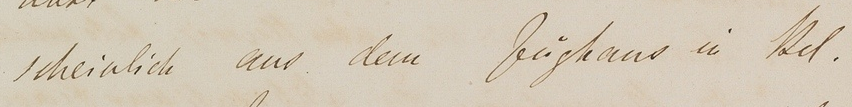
scheinlich aus dem Zeughaus in Bel-
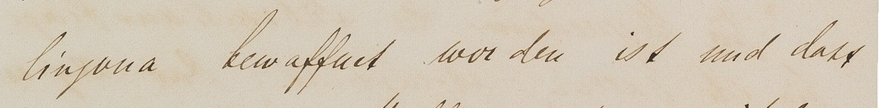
linzona bewaffnet worden ist und dass
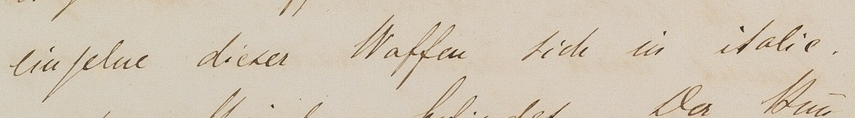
einzelne dieser Waffen sich in italie-
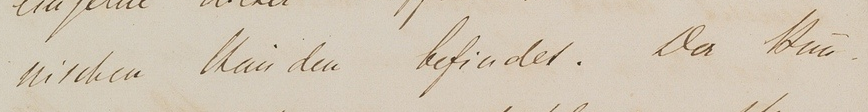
nischen Händen befindet. Der Bun-
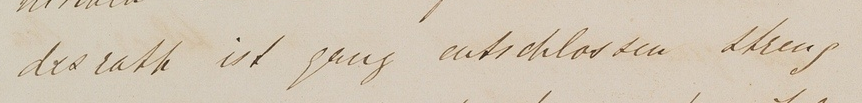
desrath ist ganz entschlossen streng
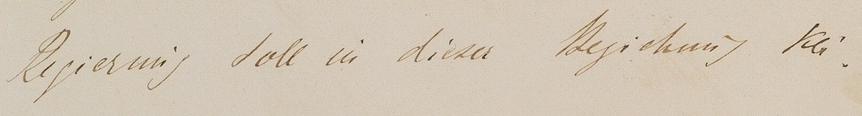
Regierung soll in dieser Beziehung kei-
